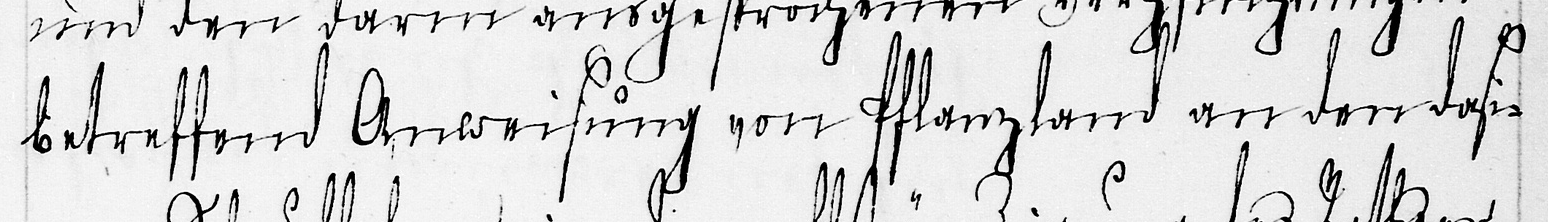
betreffend Anweisung von Pflanzland an den dasi¬
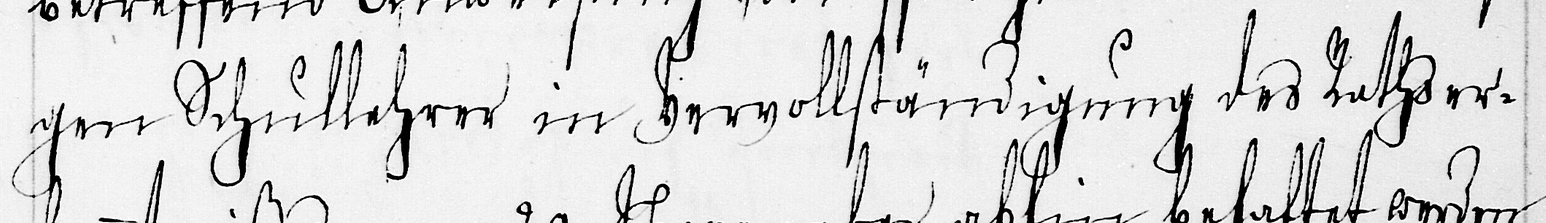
gen Schullehrer in Vervollständigung des Rathser¬
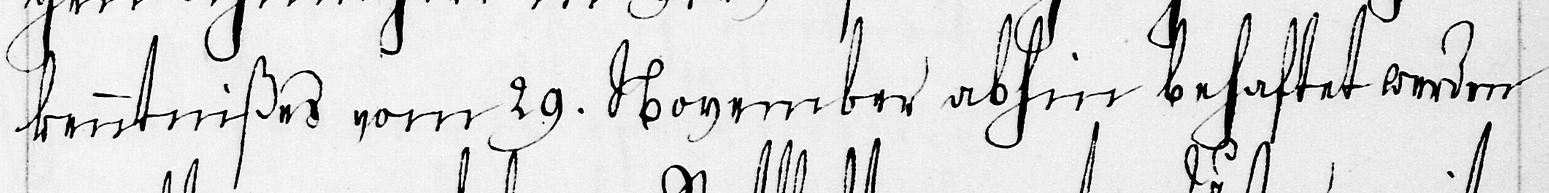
kenntnißes vom 29. November abhin behaftet werden
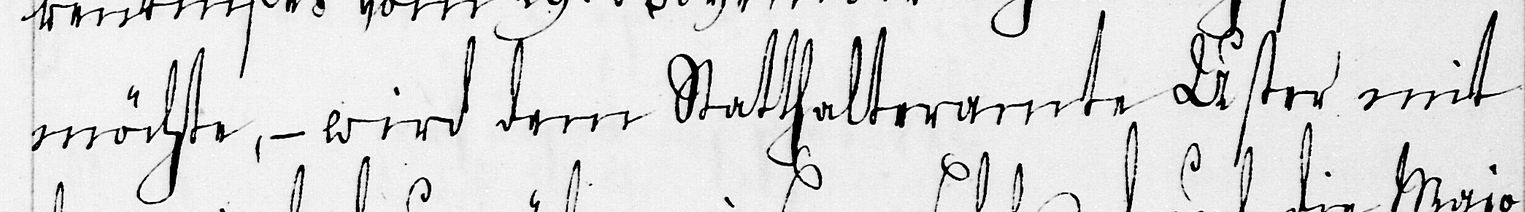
möchte, – wird dem Statthalteramte Uster mit
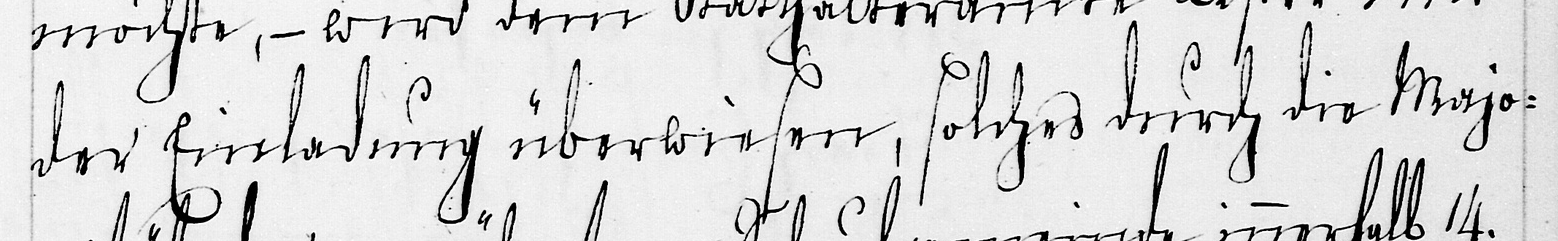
der Einladung überwiesen, solches durch die Major¬
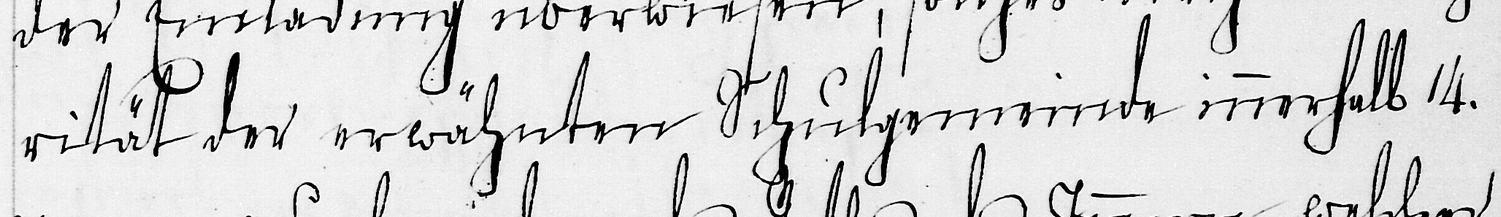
ität der erwähnten Schulgemeinde innerhalb 14.
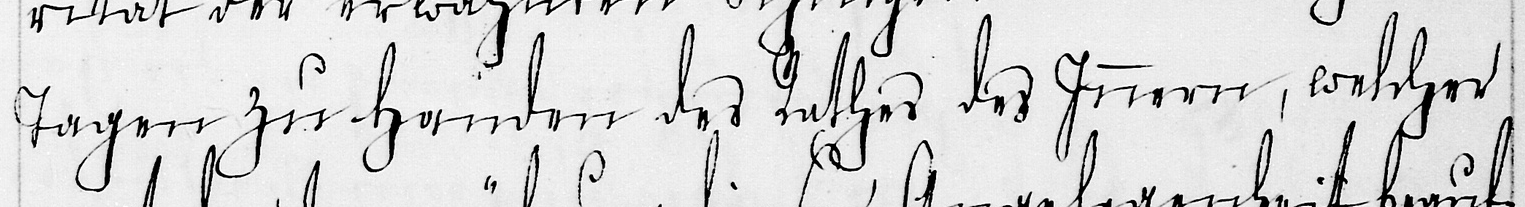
Tagen zu Handen des Rathes des Innern, welcher
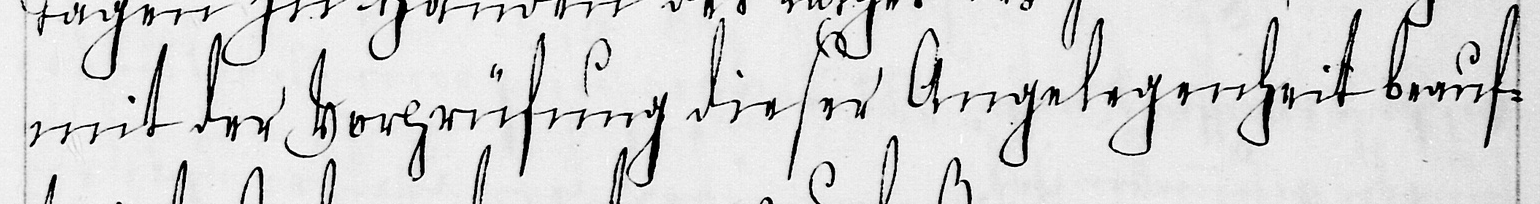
mit der Vorprüfung dieser Angelegenheit beauf¬
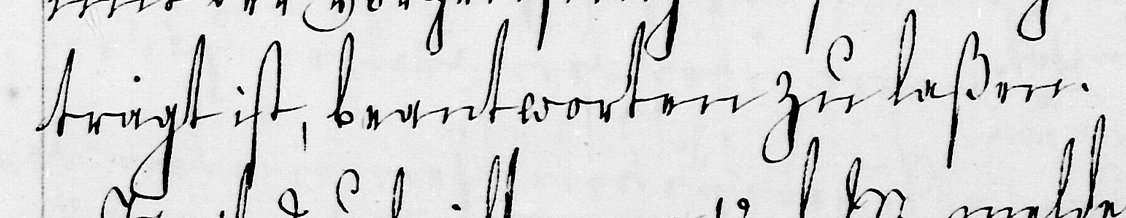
tragt ist, beantworten zu laßen.
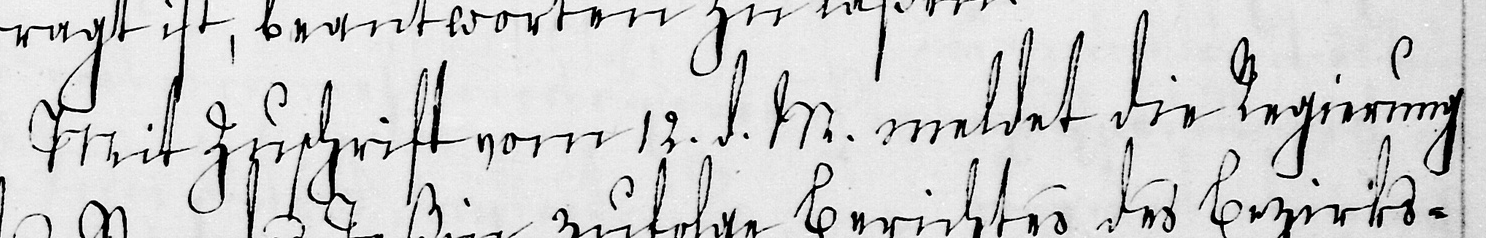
Mit Zuschrift vom 12. d. M. meldet die Regierung
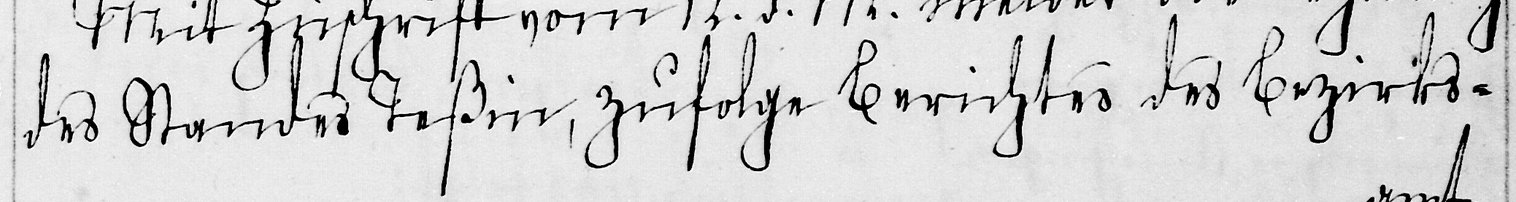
des Standes Teßin, zufolge Berichtes des Bezirks-
